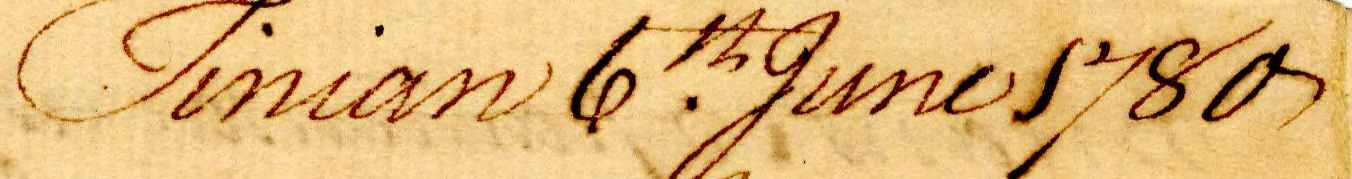Tinian 6^th June 1780
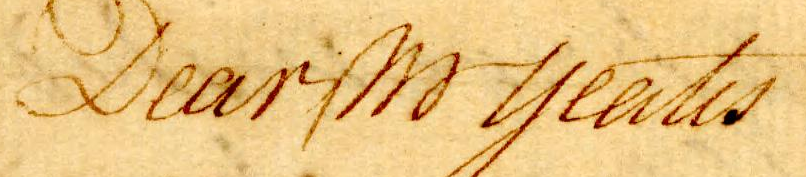Dear M^r Yeates
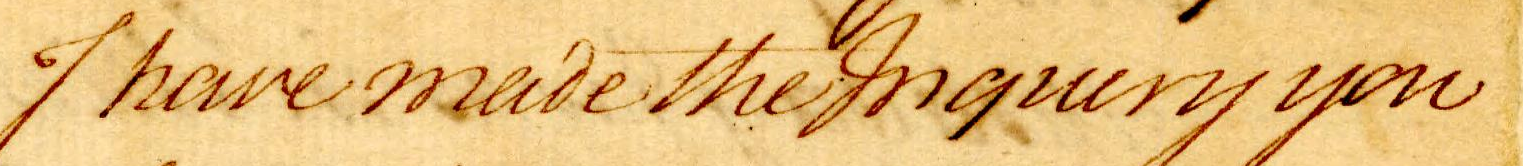I have made the Inquiry you
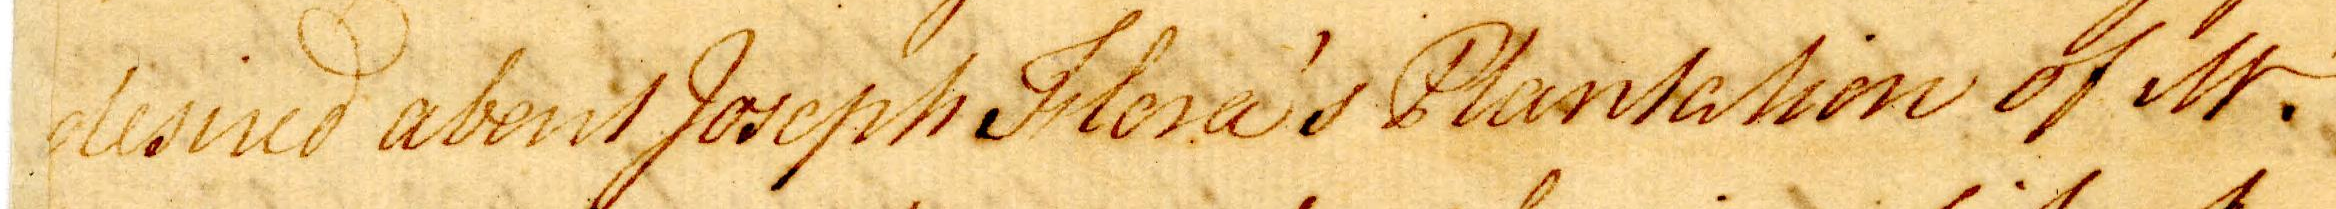desired about Joseph Flora's Plantation of M.
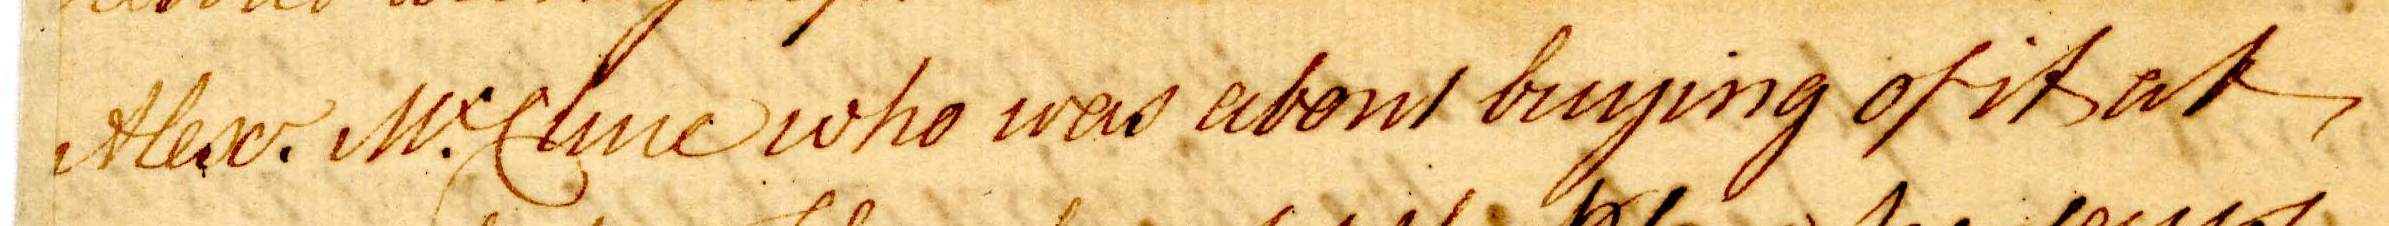Alex^r. M^r. Clure who was about buying of it at
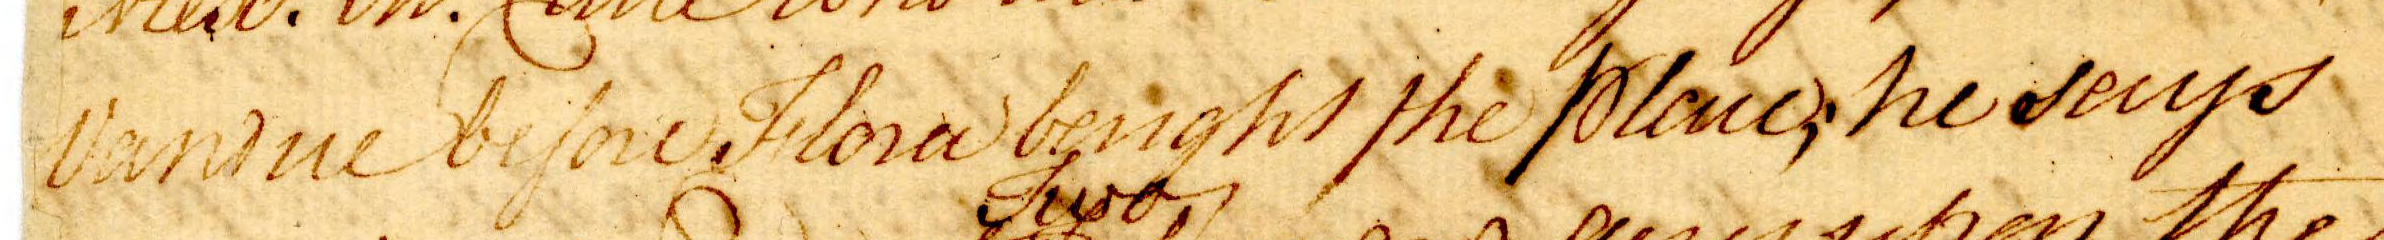Vandue before Flora bought the Place; he says
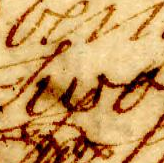two
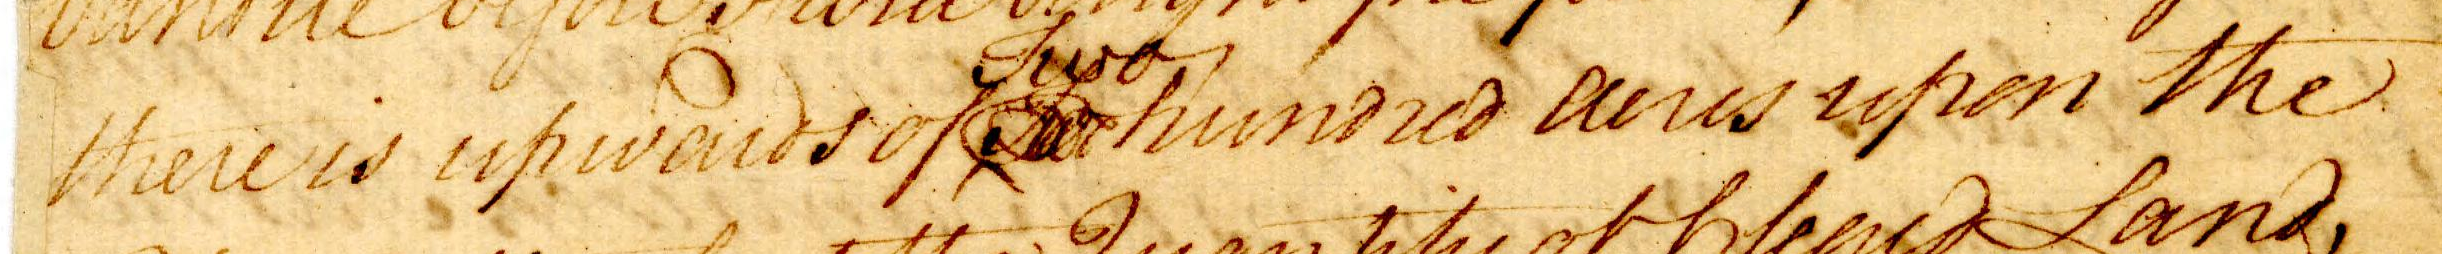there is upwards of ^ hundred acres upon the
